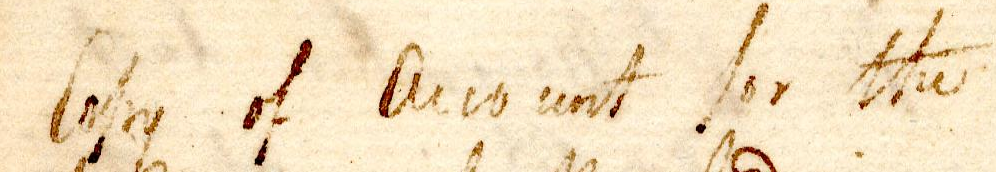Copy of Account for the
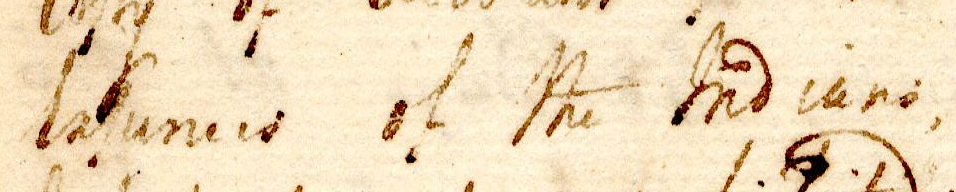Expences of the Indians,
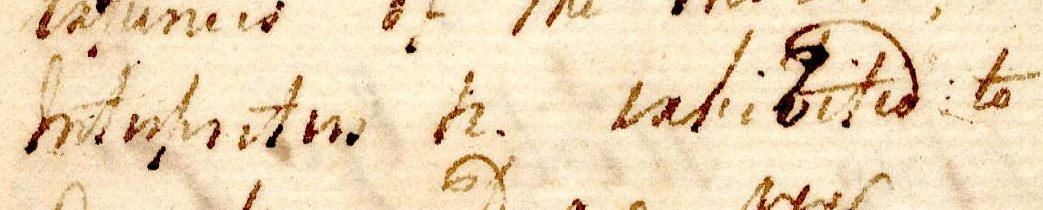Interpreters, &c. exhibited to
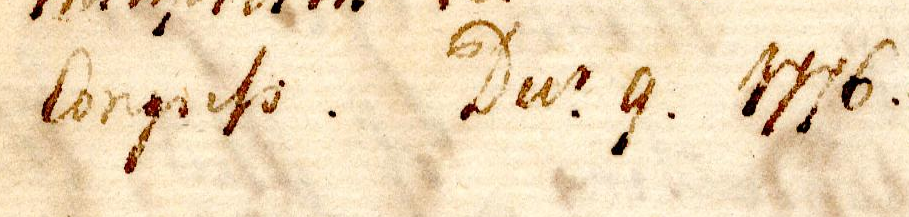Congress. Dec^r. 9. 1776.-
